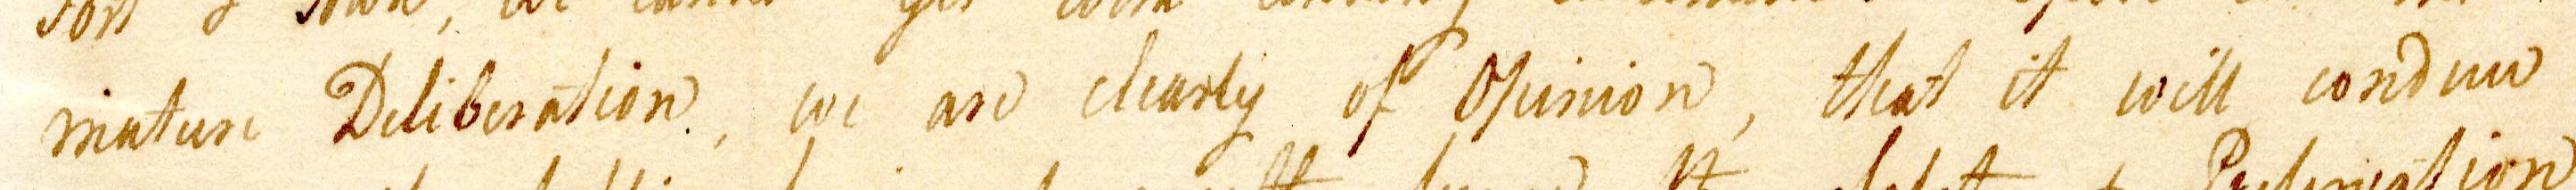mature Deliberation we are clearly of opinion, that it will conduce
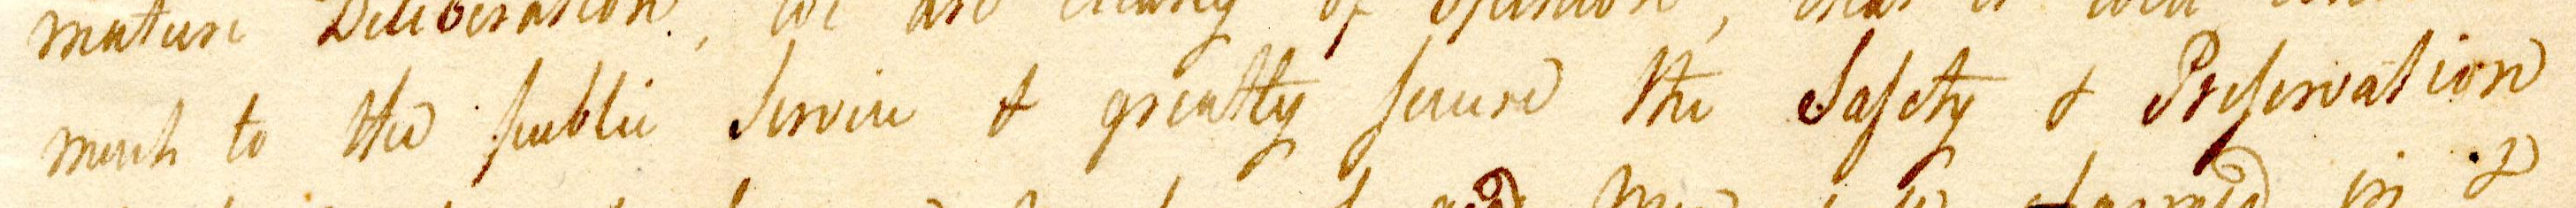much to the public Service & greatly secure the Safety & Preservation
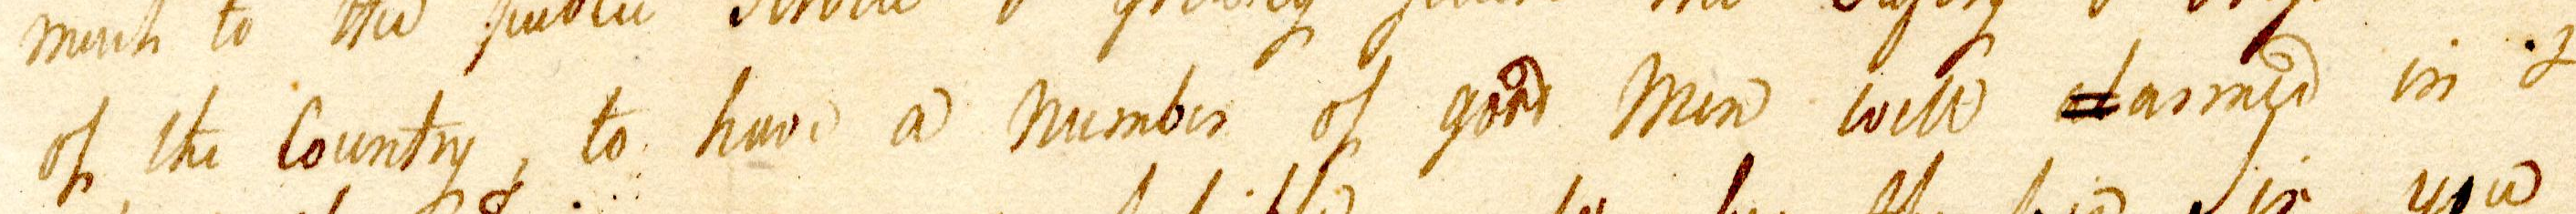of the Country, to have a Number of good Men well alarmed in &
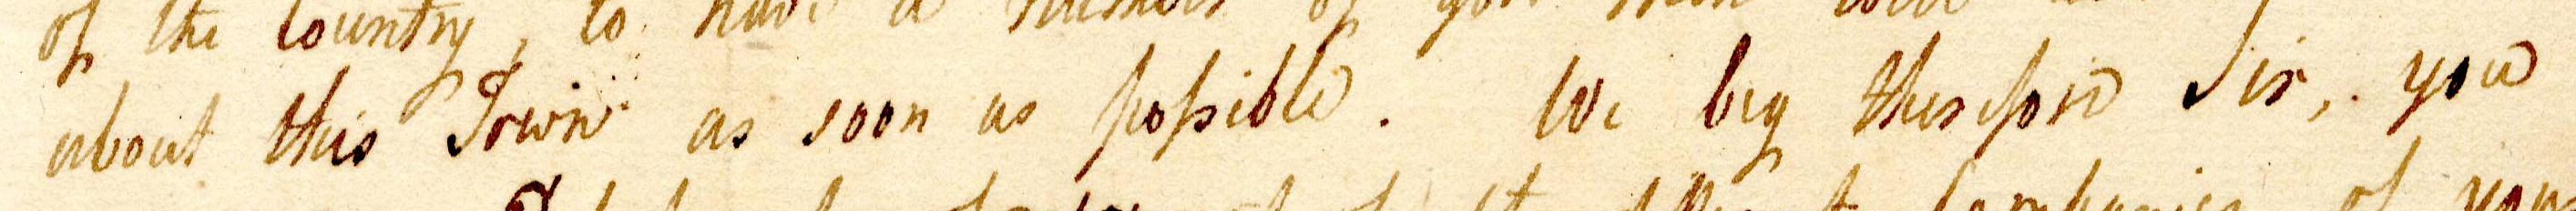about this Town as soon as possible. We beg therefore Sir, you
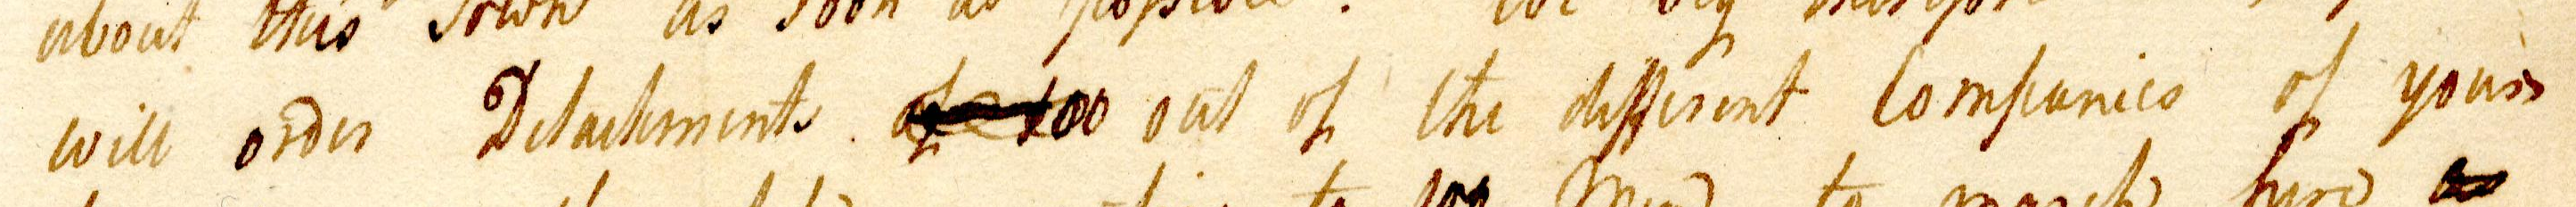will order Detachments [of 100] out of the different Companies of your
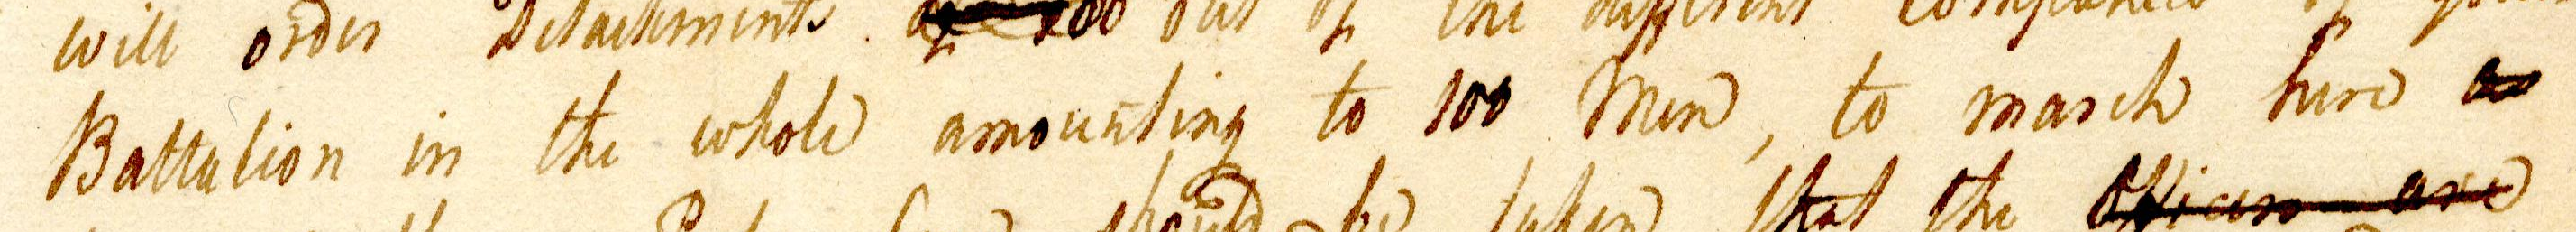Battalion in the whole amounting to 100 Men, to march here [as]
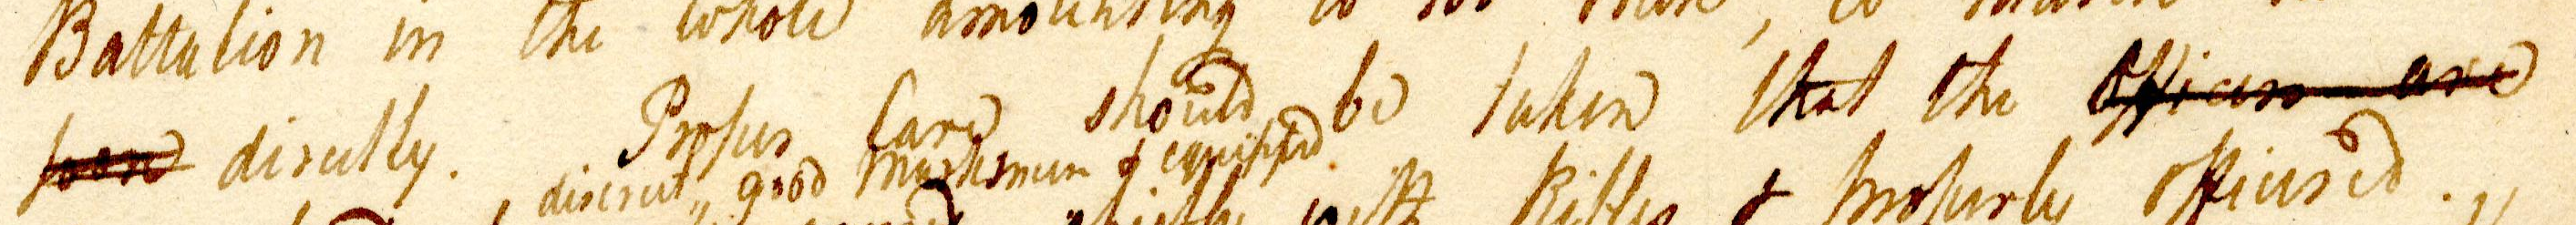[soon] directly. Proper Care should be taken that the [Officers are]
